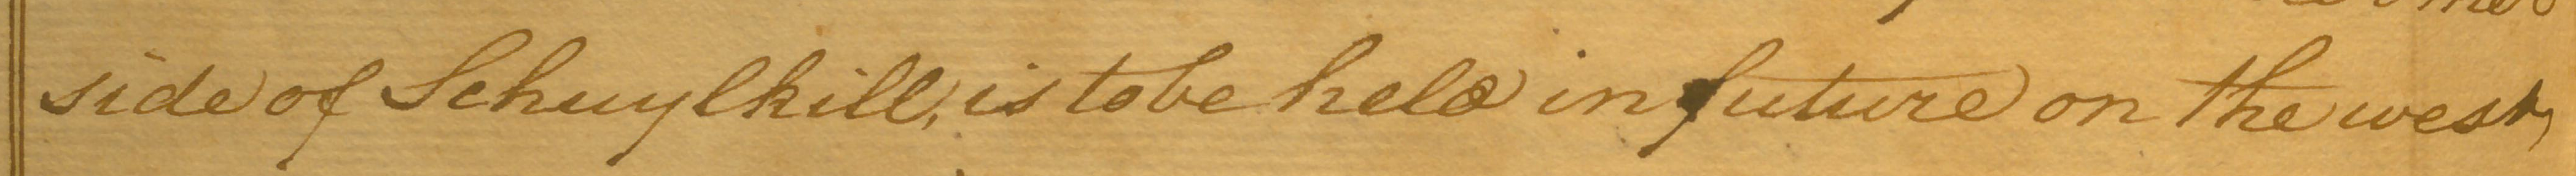side of Schuylkill, is to be held in future on the west,
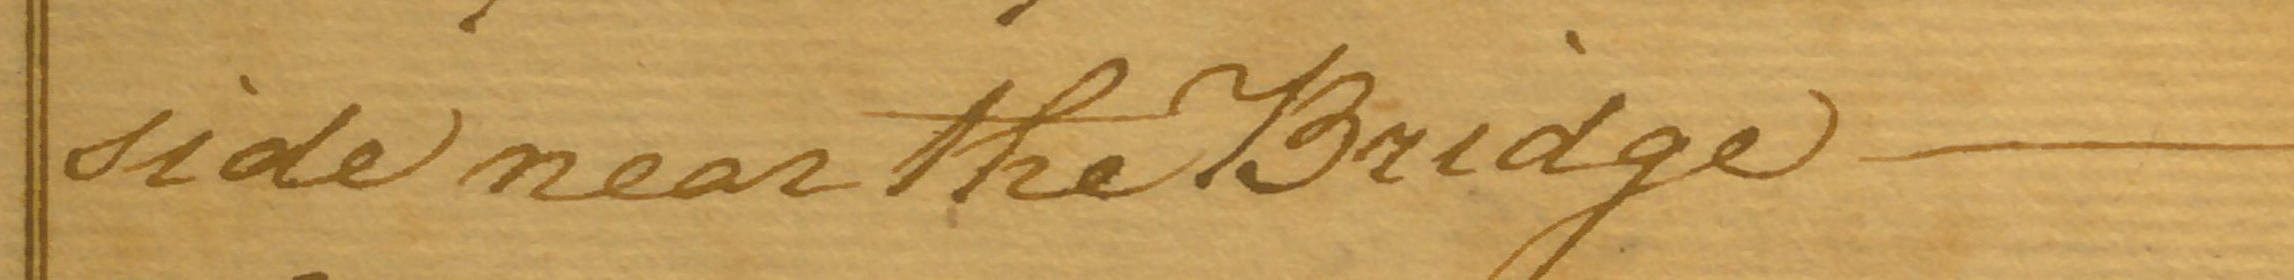side near the Bridge-
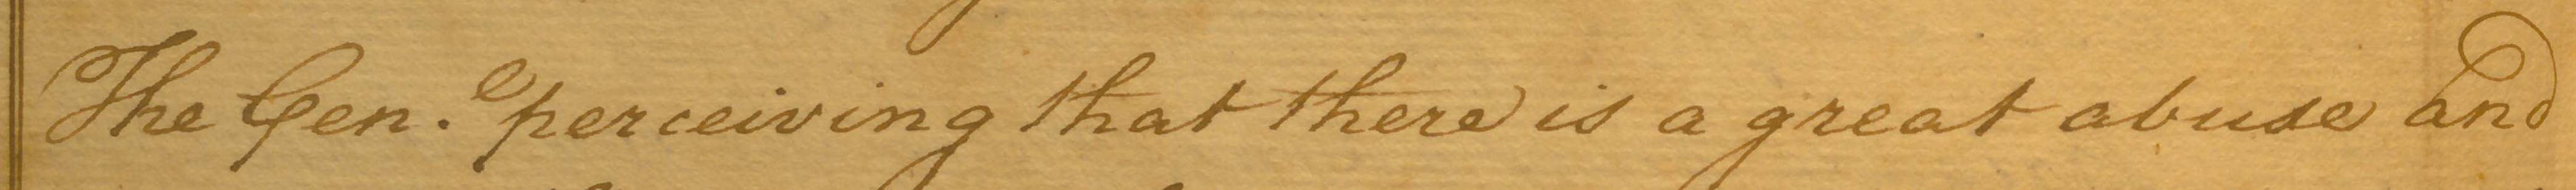The Gen^l. perceiving that there is a great abuse and
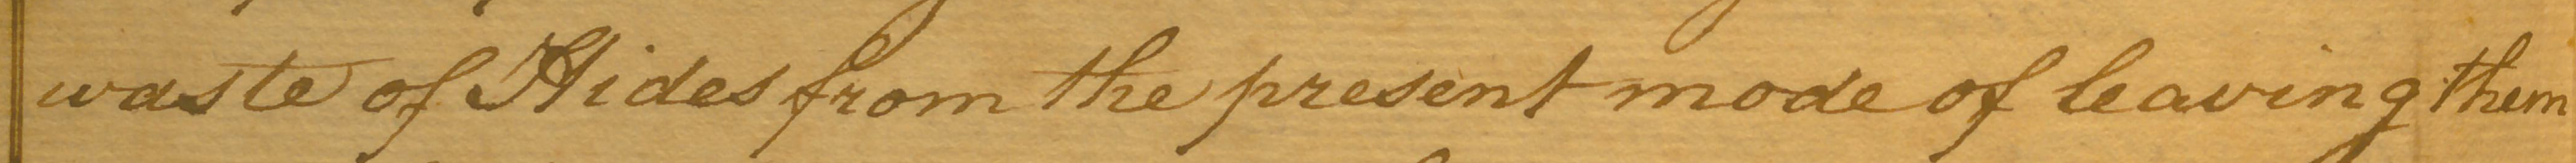waste of Hides from the present mode of leaving them
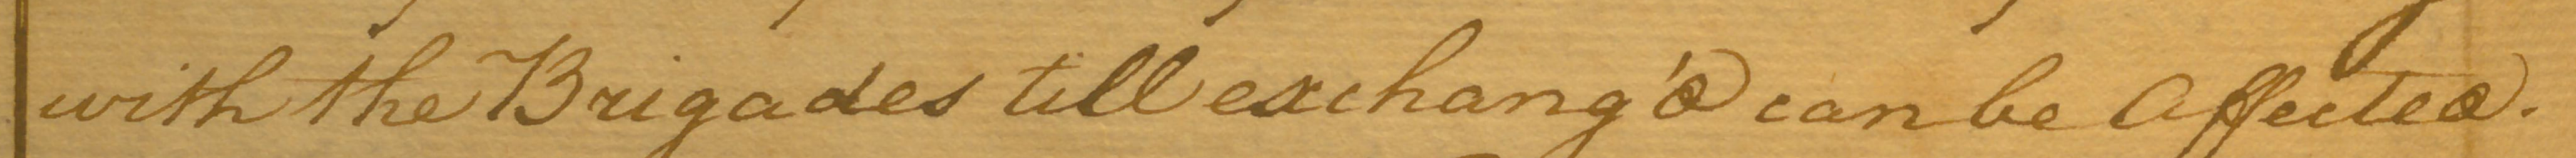with the Brigades till exchang'd can be Affected.
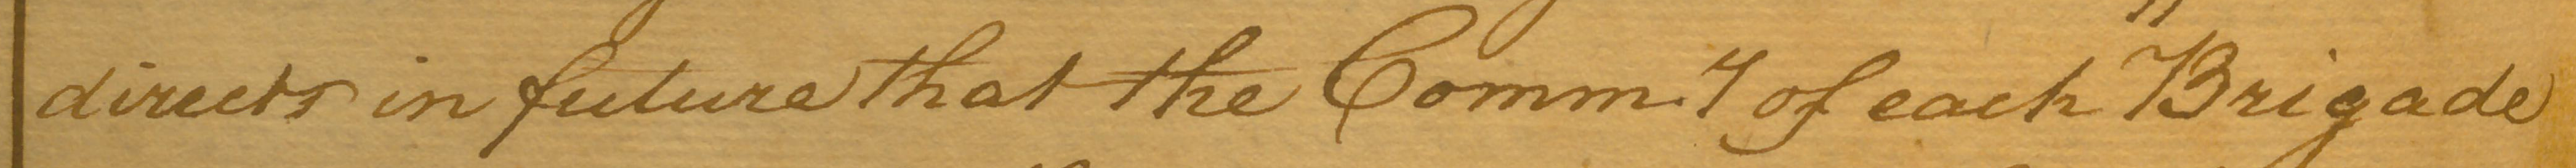directs in future that the Comm^y. of each Brigade
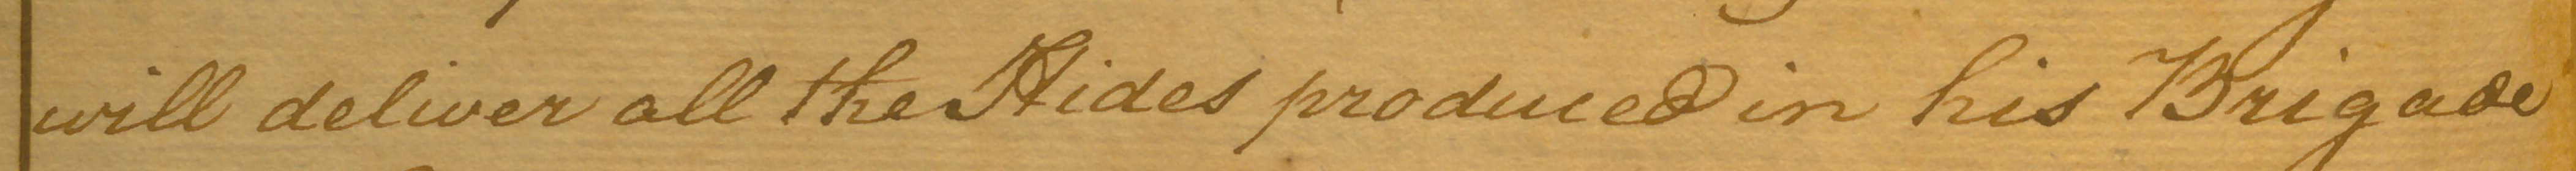will deliver all the Hides produced in his Brigade
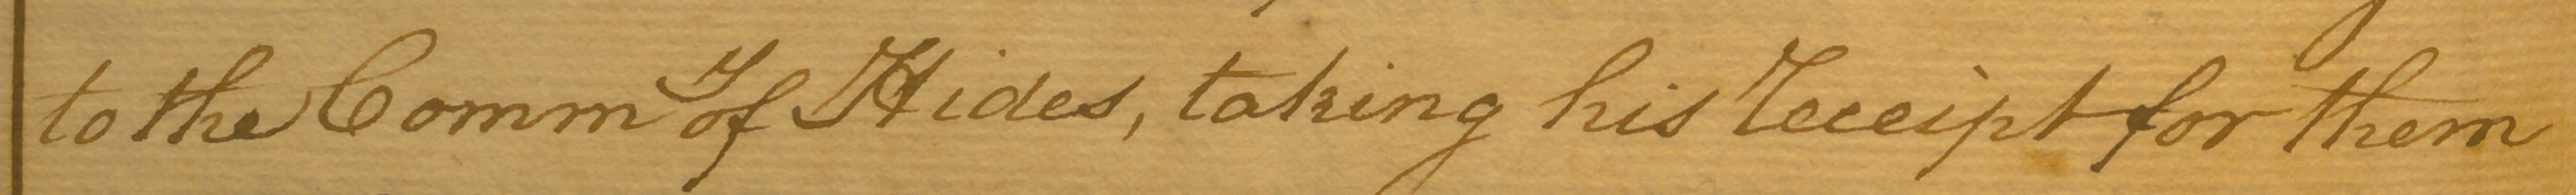to the Comm^y of Hides, taking his receipt for them
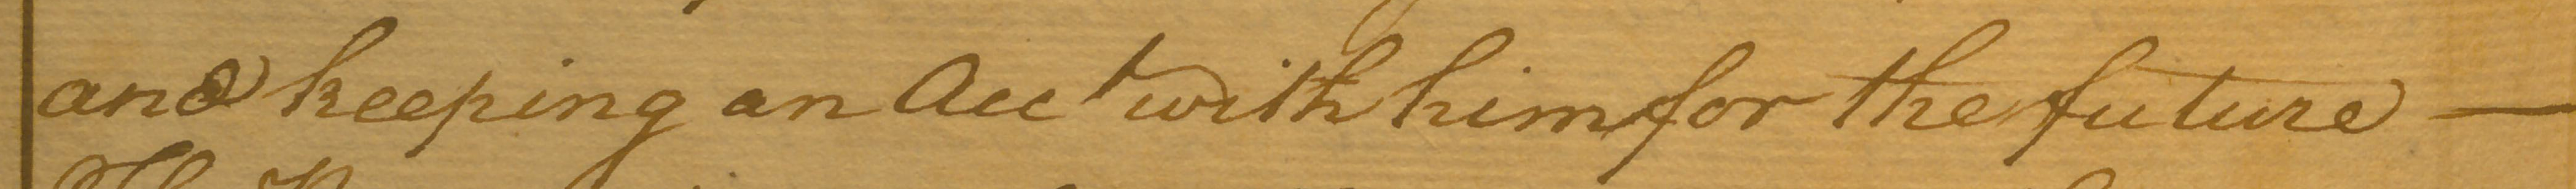and keeping an Acc^t with him for the future-
